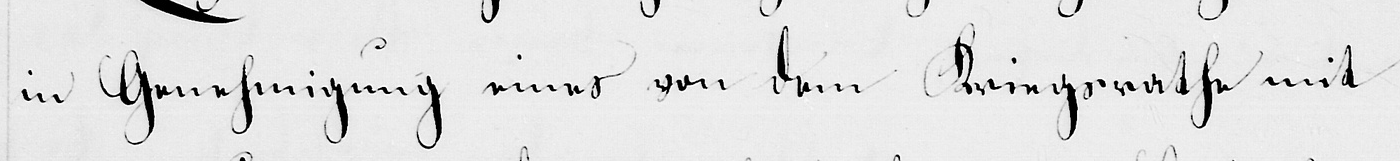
in Genehmigung eines von dem Kriegsrathe mit
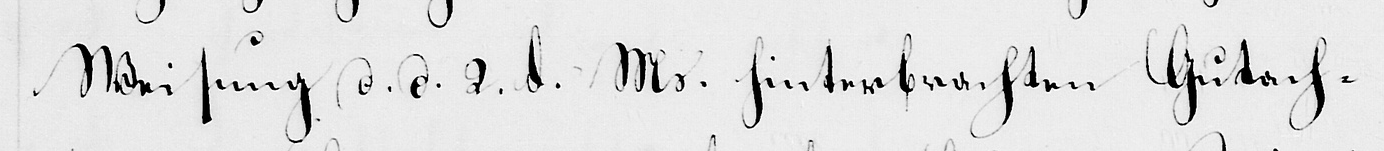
Weisung d. d. 2. d. Ms. hinterbrachten Gutach¬
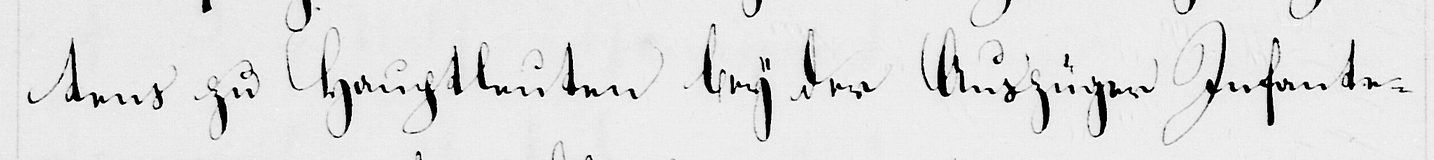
tens zu Hauptleuten bey den Auszüger Infante¬
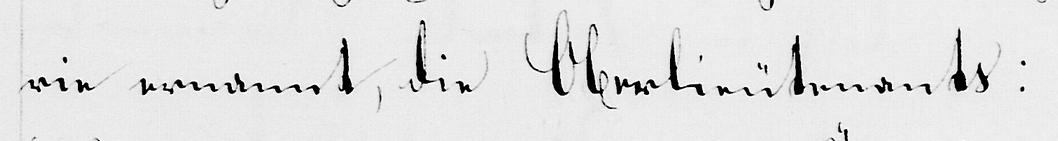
rie ernannt, die Oberlieutenants:
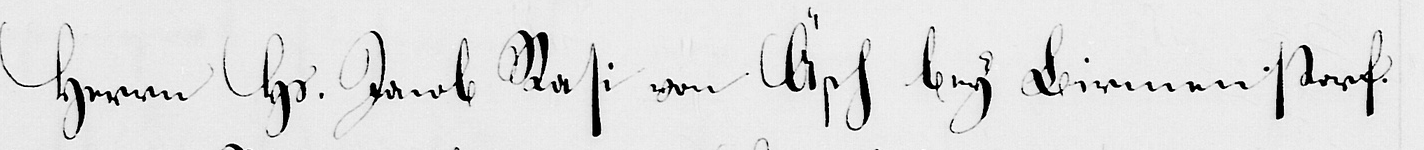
Herrn Hs. Jacob Rasi von Äsch bey Birmensdorf.
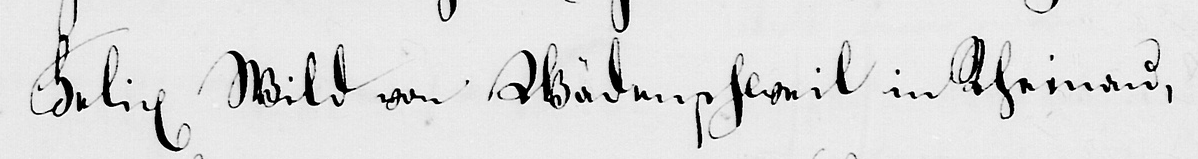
elix Wild von Wädenschweil in Rheinau,
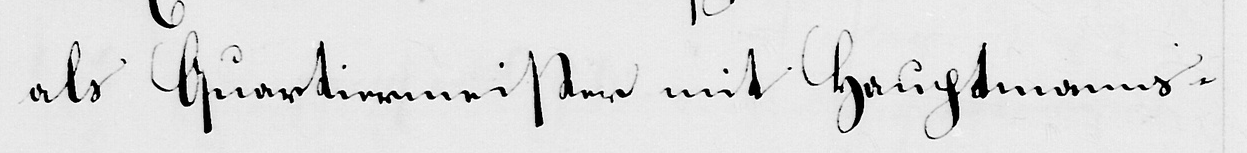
als Quartiermeister mit Hauptmanns¬
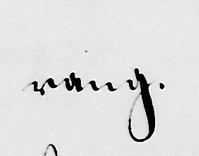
rang.
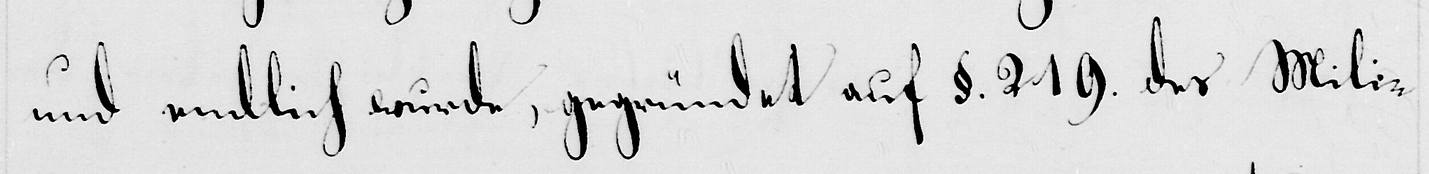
und endlich wurde, gegründet auf §. 219. des Mili-
